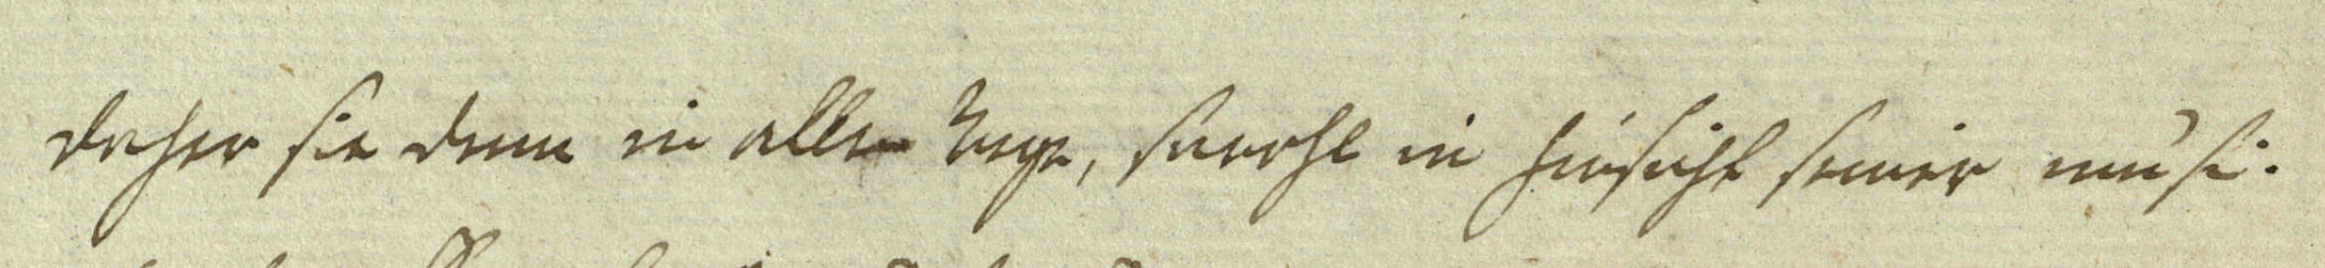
daher sie denn in allen Wege, sowohl in hinsicht seiner musi¬
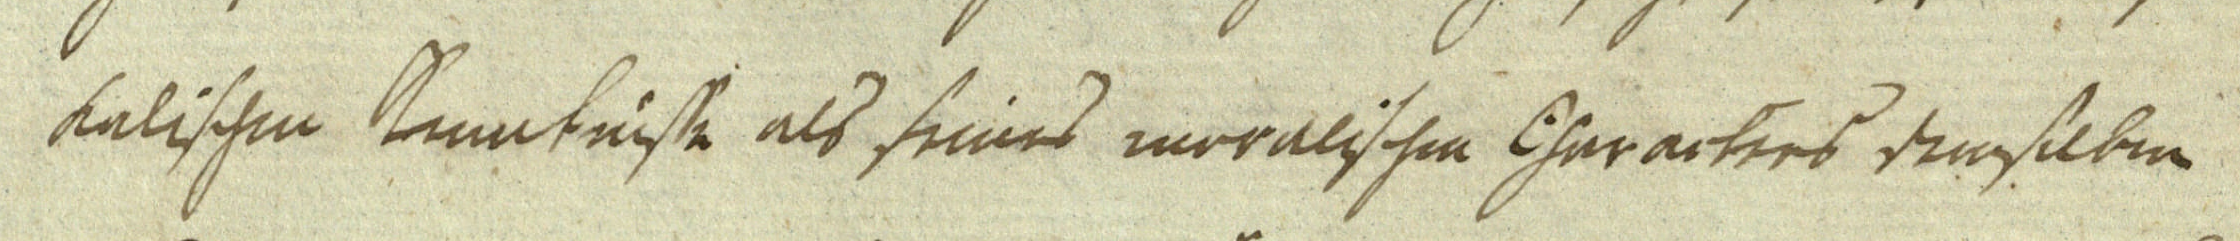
kalischen Kenntnisse als seines moralischen Characters demselben
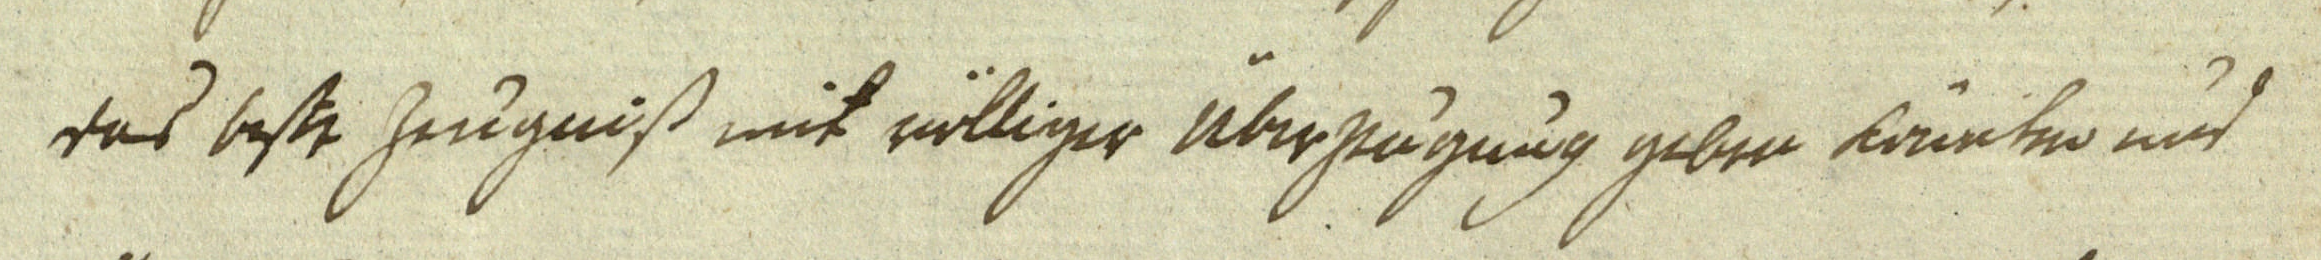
das beste Zeugniß mit völliger Überzeugung geben könnten und
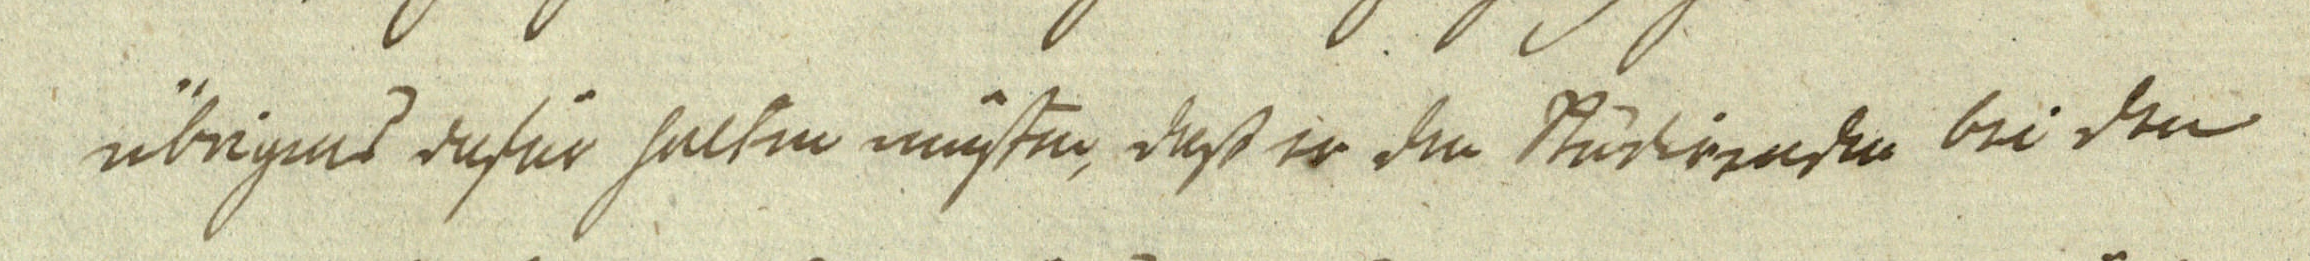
übrigens dafür halten müsten, daß er den Studirenden bei den
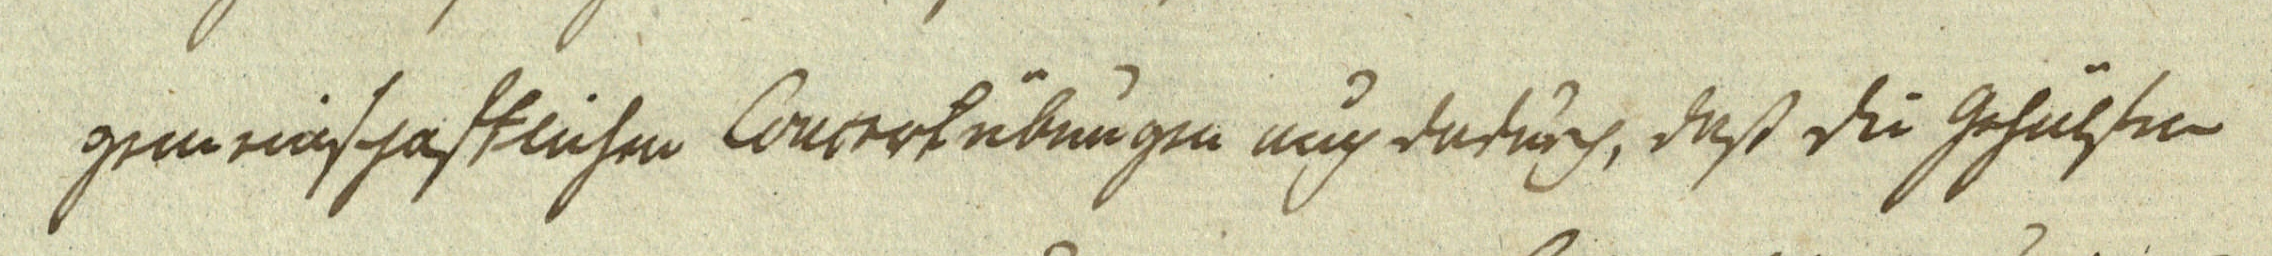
gemeinschaftlichen Concertübungen auch dadurch, daß die Gehülfen
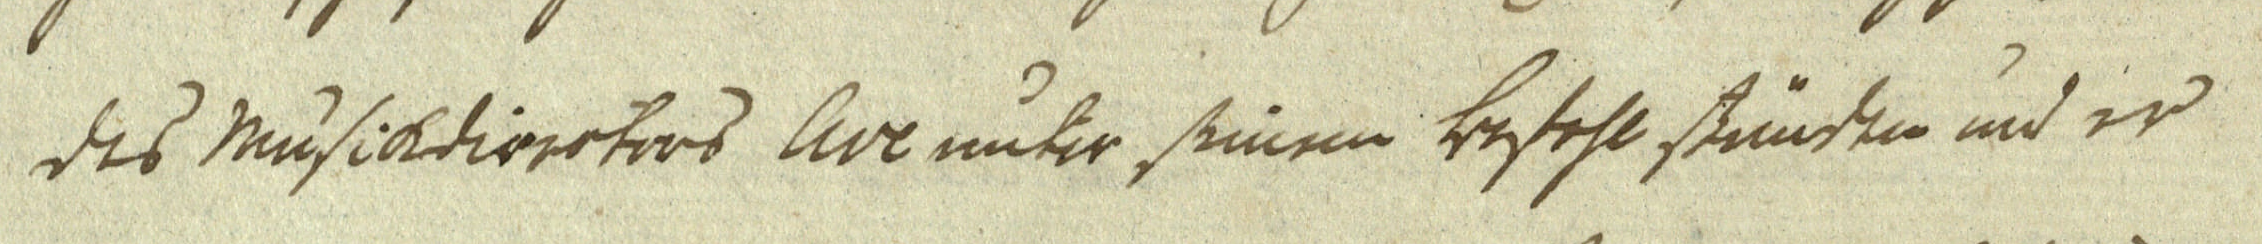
des Musikdirectors Ave unter seinem Befehl stünden und er
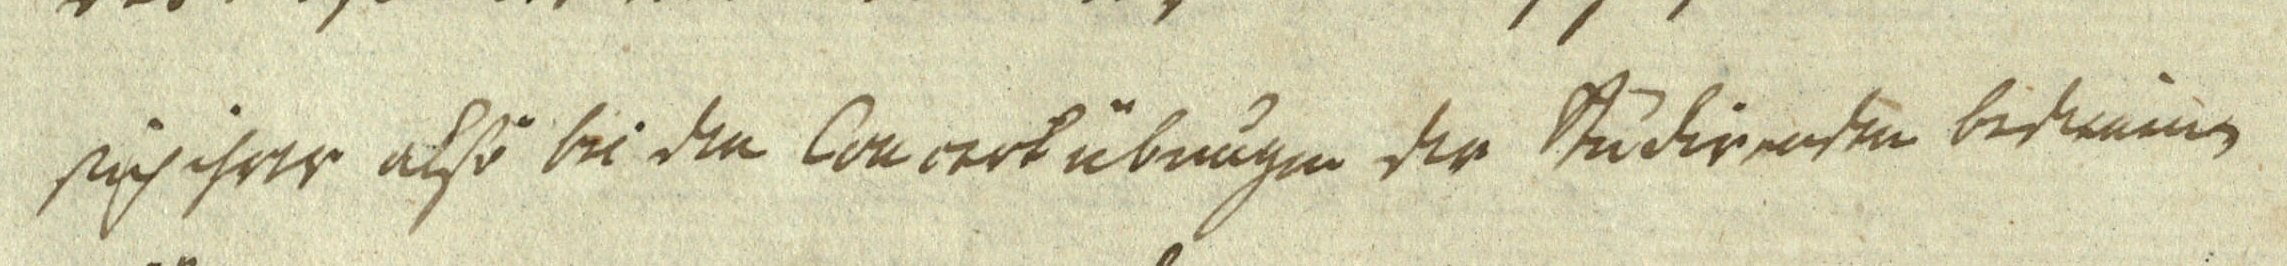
sich ihrer also bei den Concertübungen der Studirenden bedienen
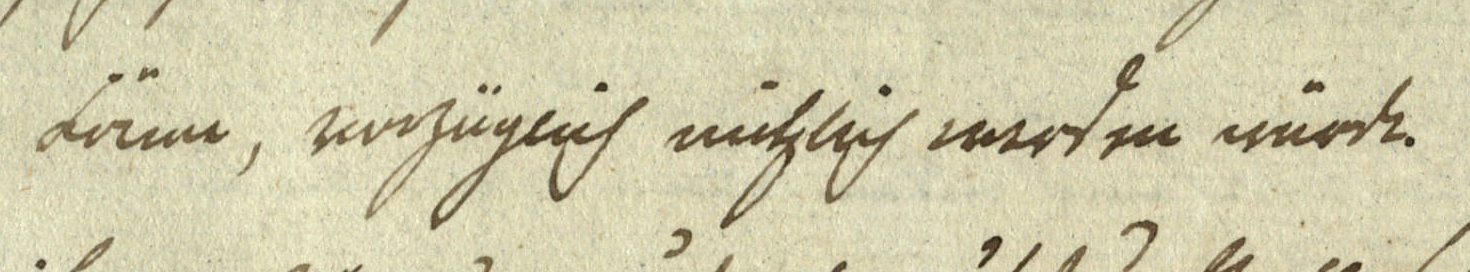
könne, vorzüglich nützlich werden würde.
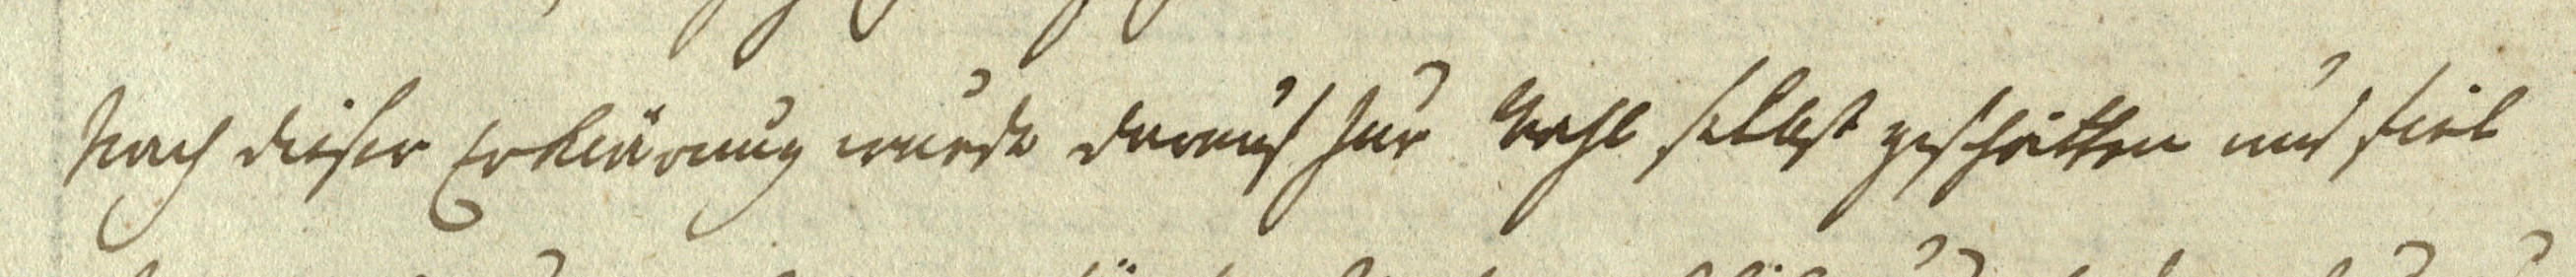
Nach dieser Erklärung wurde darauf zur Wahl selbst geschritten und fiel
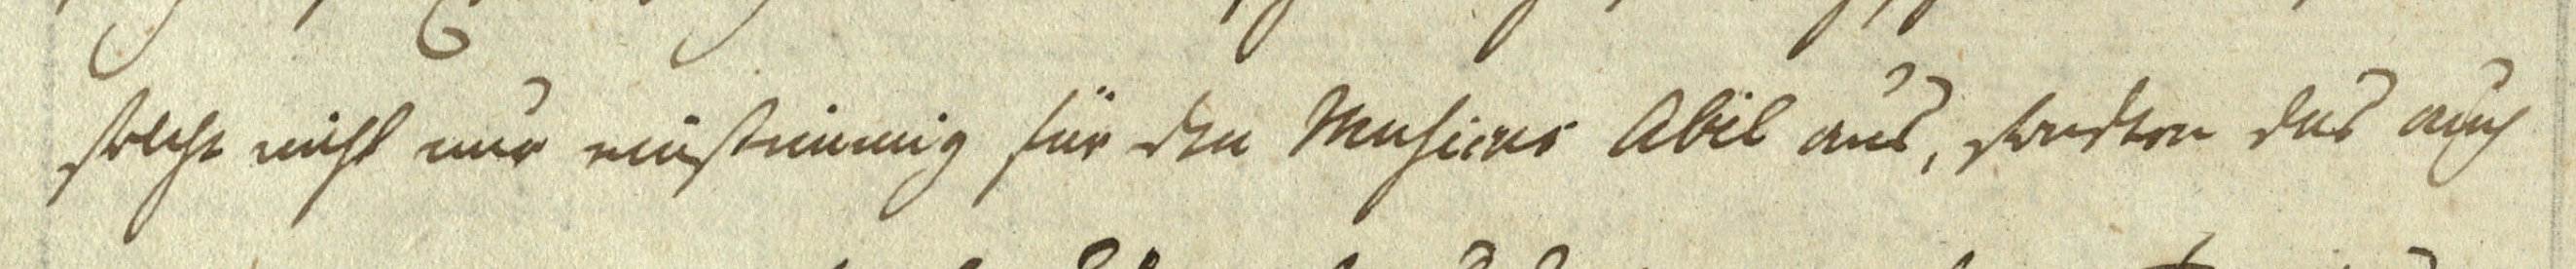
solche nicht nur einstimmig für den Musicus Abel aus, sondern das auch
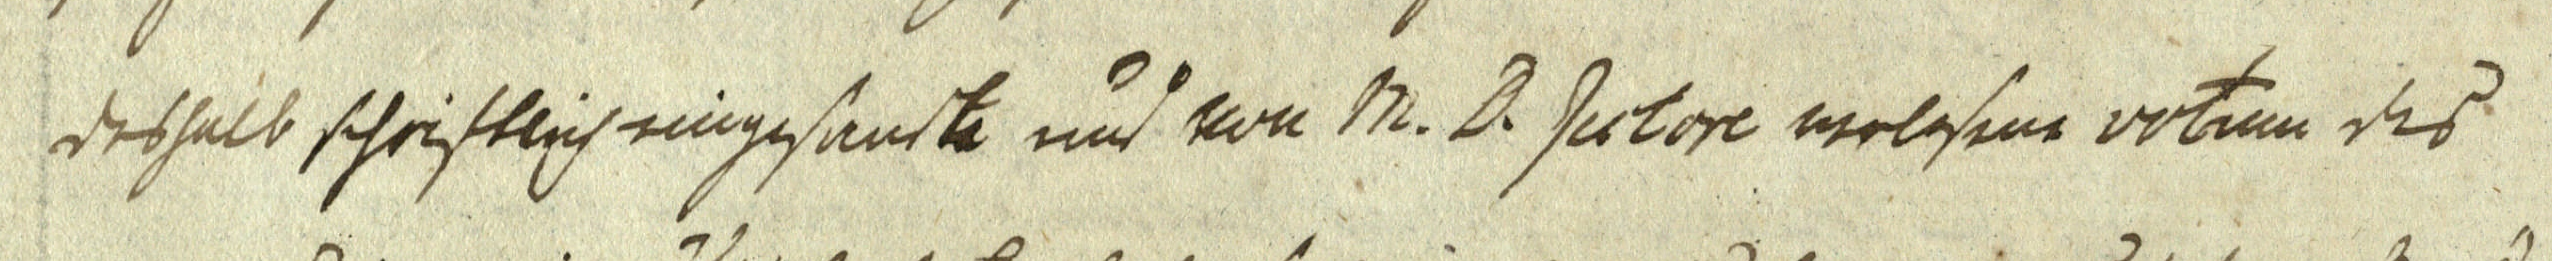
deshalb schriftlich eingesandte und von M. D. Rectore verlesene votum des
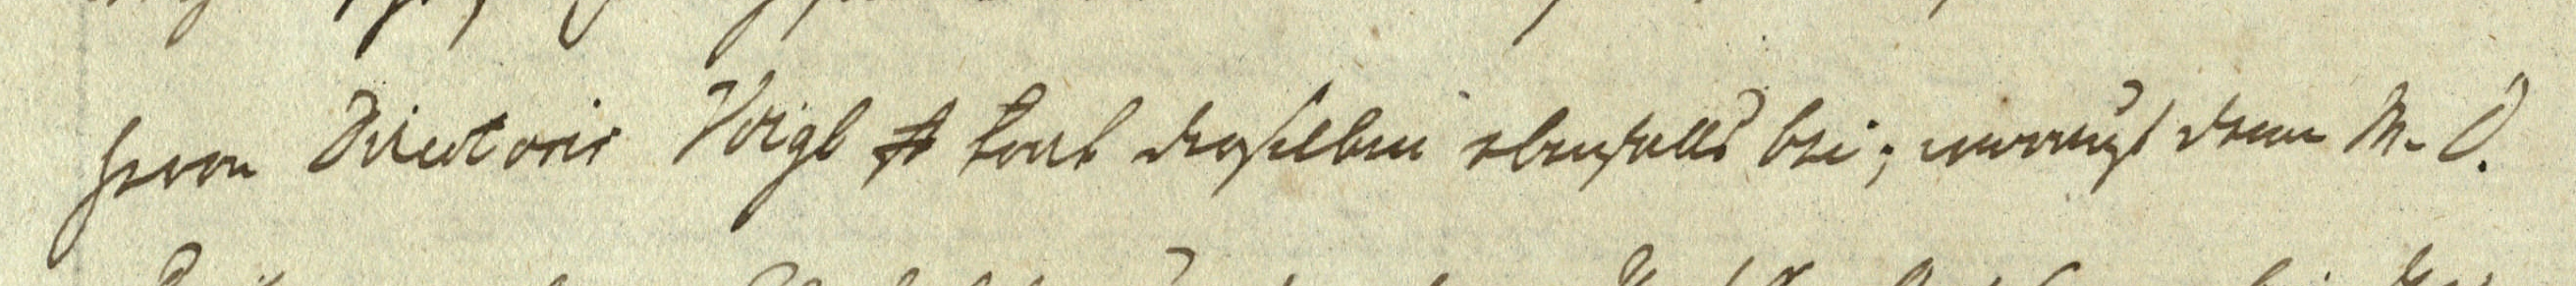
Herrn Directoris Voigt st trat derselben ebenfalls bei; worauf denn M. D.
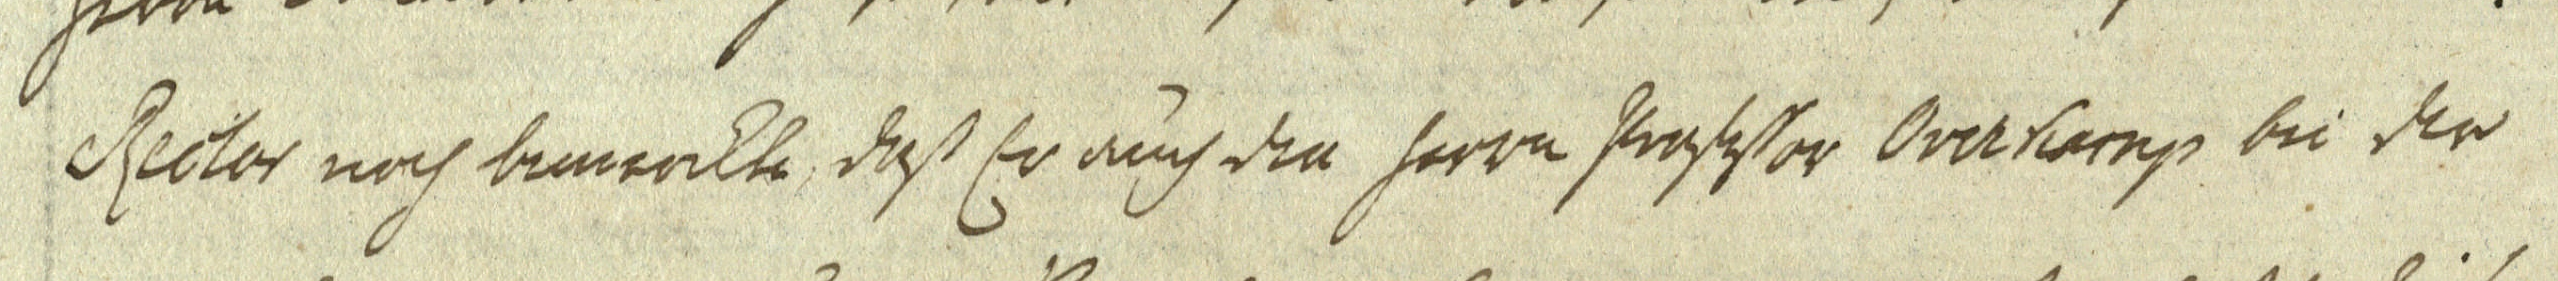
Rector noch bemerckte, daß Er auch den Herrn Professor Overkamp bei der
